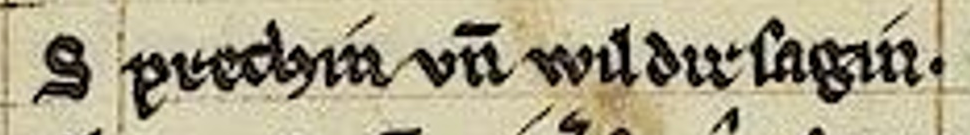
Sprechin vn(d) wil dir ſagin.
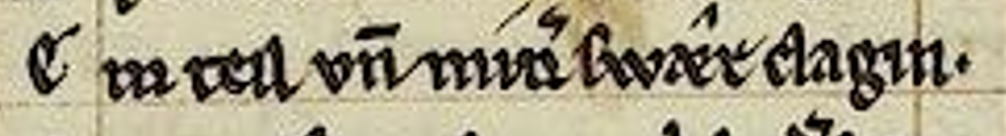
Ein teil vn(d) min(er) ſw[ae]r clagin.
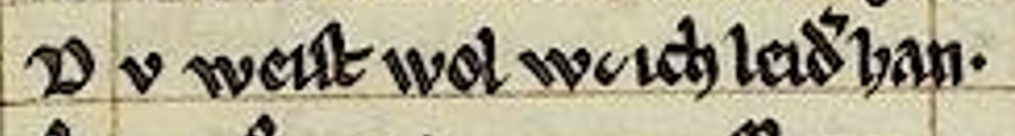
Dv weiſt wol w(az) ich leid(er) han.
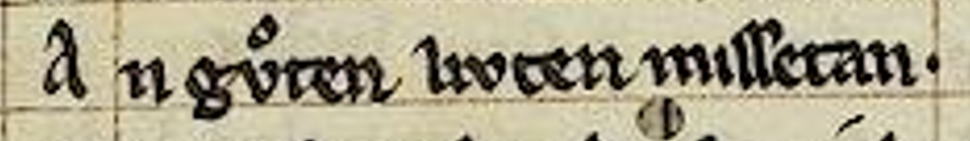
An gv°oten livten miſſetan.
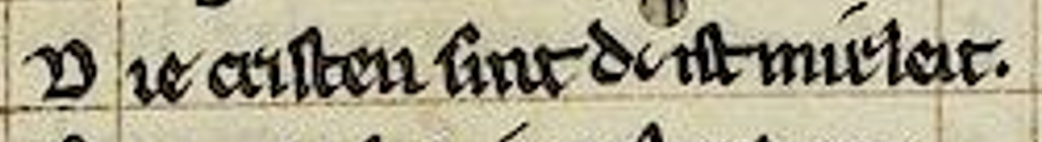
Die criſten ſint d(az) iſt mir leit.
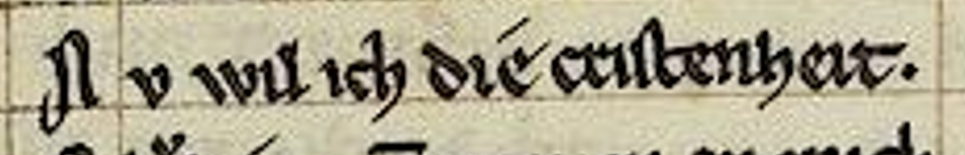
Nv wil ich die criſtenheit.
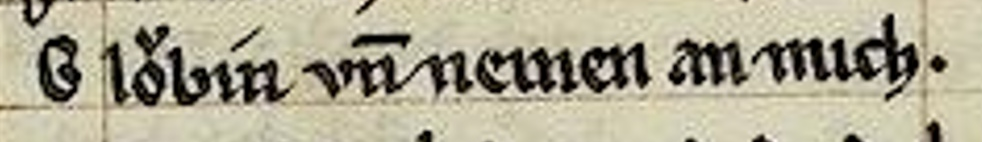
Glo°vbin vn(d) nemen an mich.
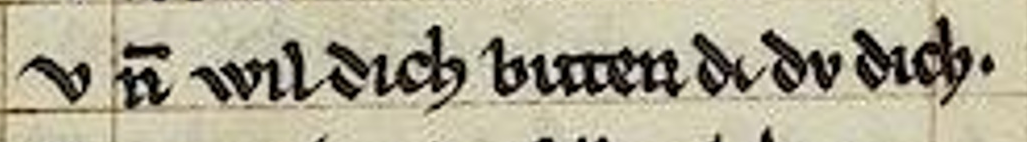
Vn(d) wil dich bitten d(az) dv dich.
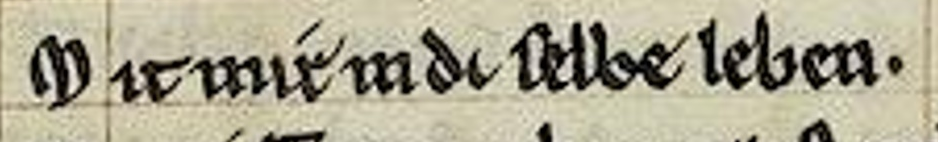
Mit mir in d(az) ſelbe leben.
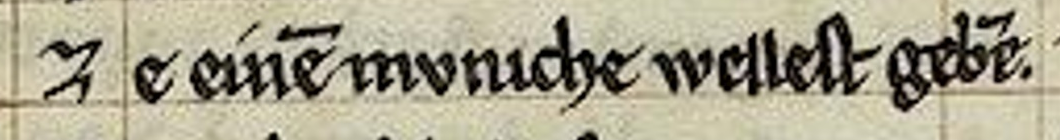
Ze eine(m) mvniche welleſt gebe(n).
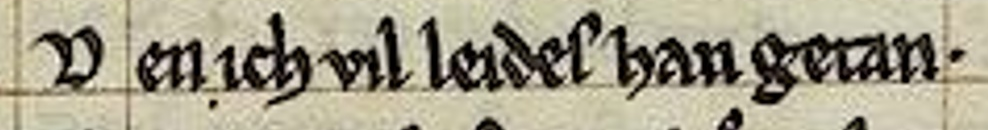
Den ich vil leideſ han getan.
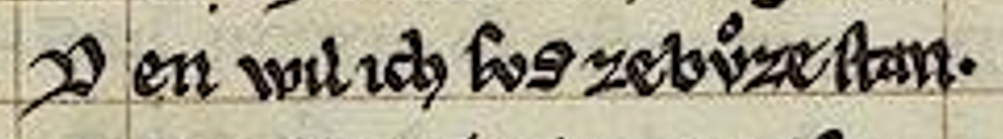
Den wil ich ſvs zebv°oze ſtan.
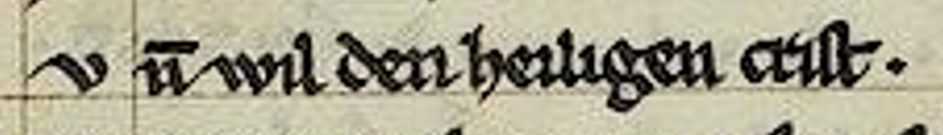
Vn(d) wil den heiligen criſt.
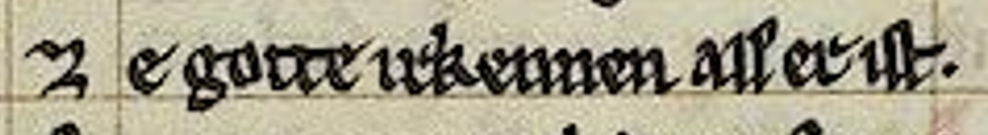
Ze gotte irkennen alſ er iſt.
